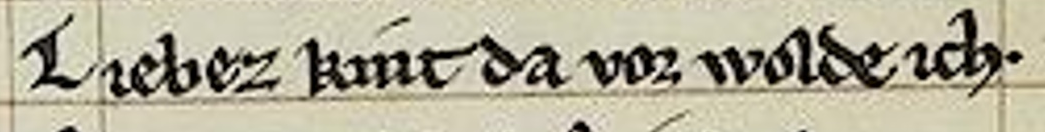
Liebez kint da vor wolde ich.
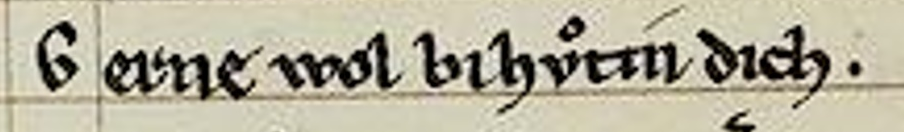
Gerne wol bihv°otin dich.
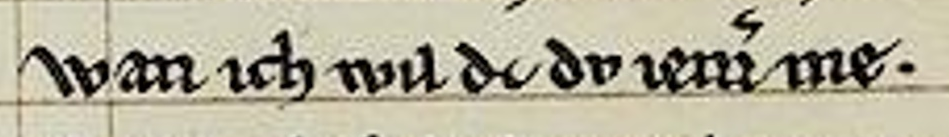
Wan ich wil d(az) dv iem(er) me.
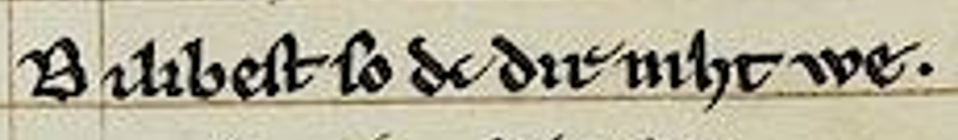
Bilibeſt ſo d(az) dir niht we.
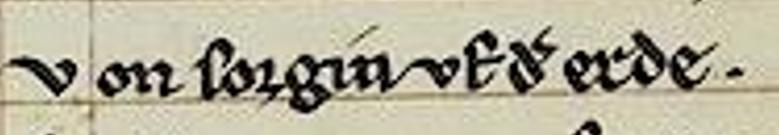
Von ſorgin vf d(er) erde.
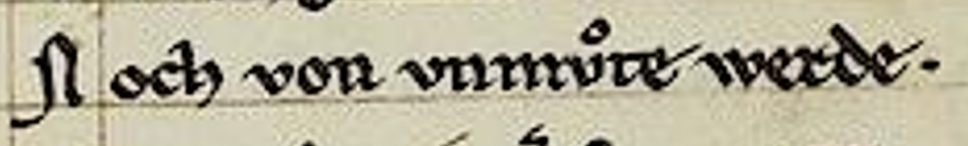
Noch von vnmv°ote werde.
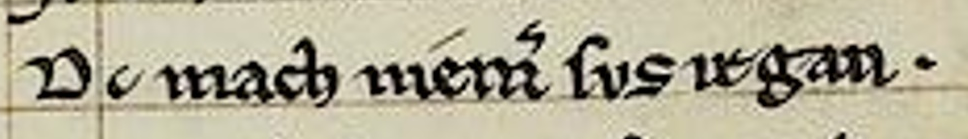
D(az) mach niem(er) ſvs irgan.
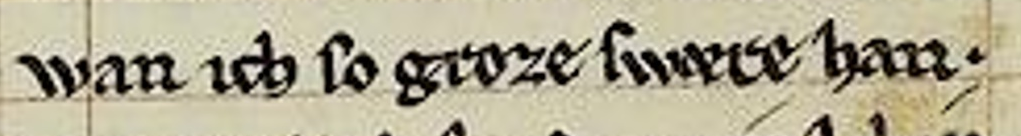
Wan ich ſo groze ſw[ae]re han.
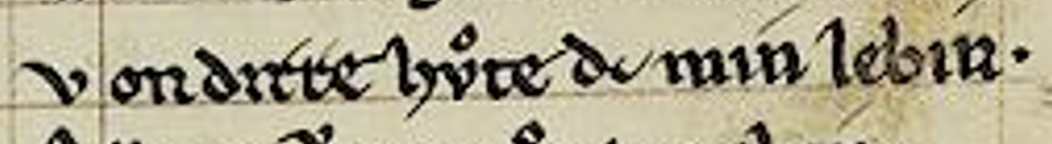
Von dirre hv°ote d(az) min lebin.
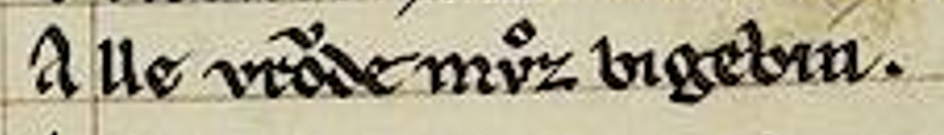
Alle vro°vde mv°oz bigebin.
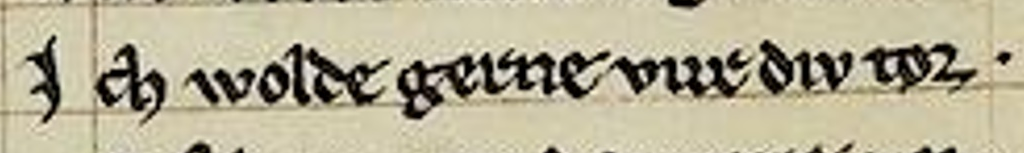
Ich wolde gerne vur div tor.
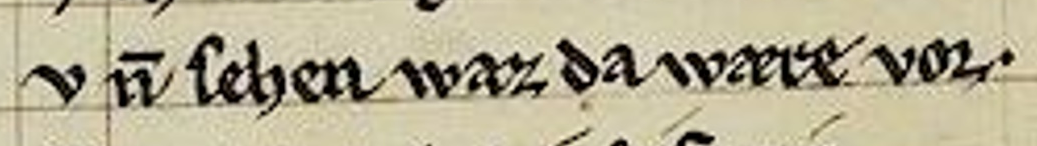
Vn(d) ſehen waz da w[ae]re vor.
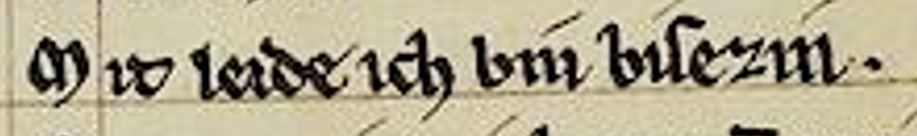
Mit leide ich bin biſezin.
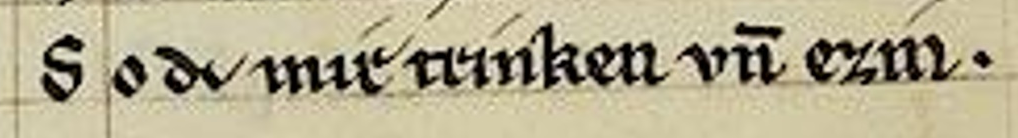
So d(az) mir trinken vn(d) ezin.
